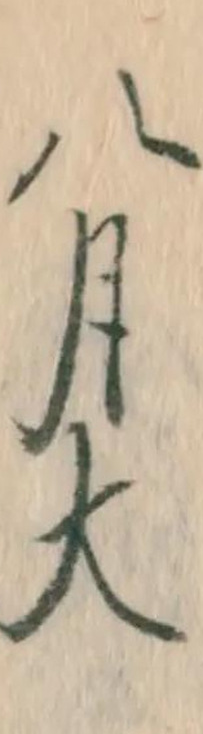八月大
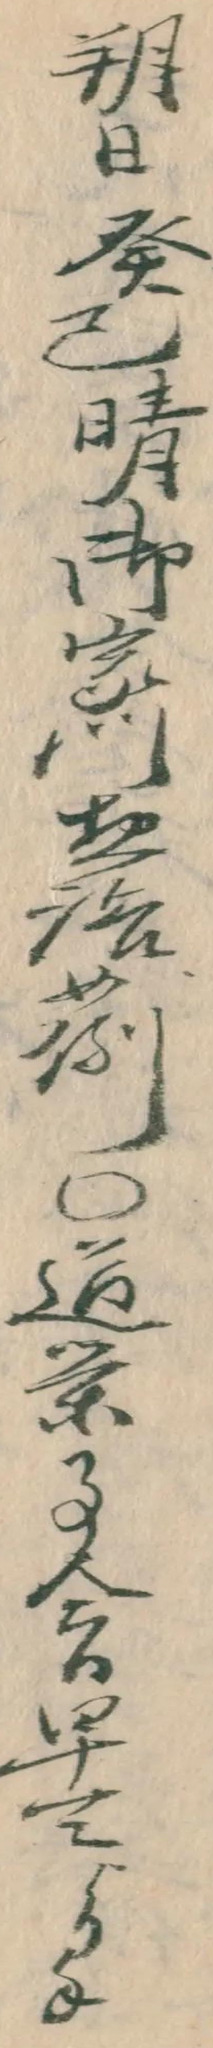朔日癸巳晴御家門惣詰如例〇道栄事合早天より手
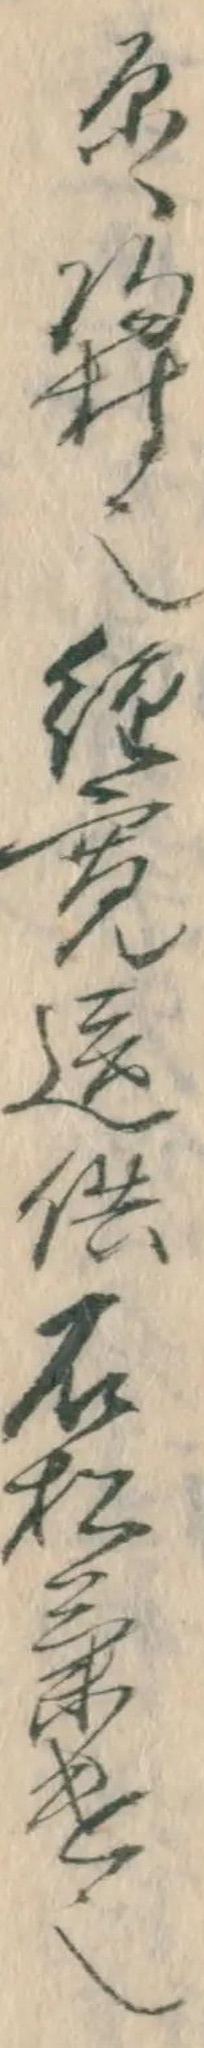原へ帰村也経寛送供石松葉遣之
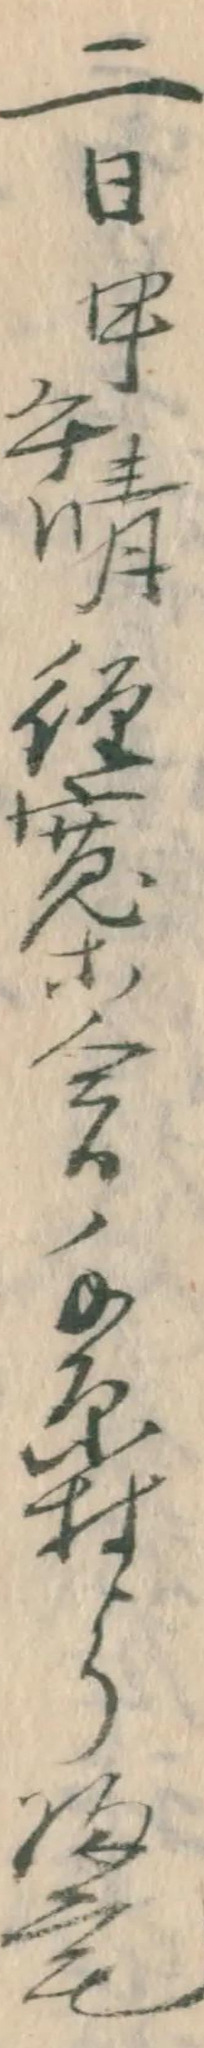二日甲午晴経寛等今日手原村より帰宅
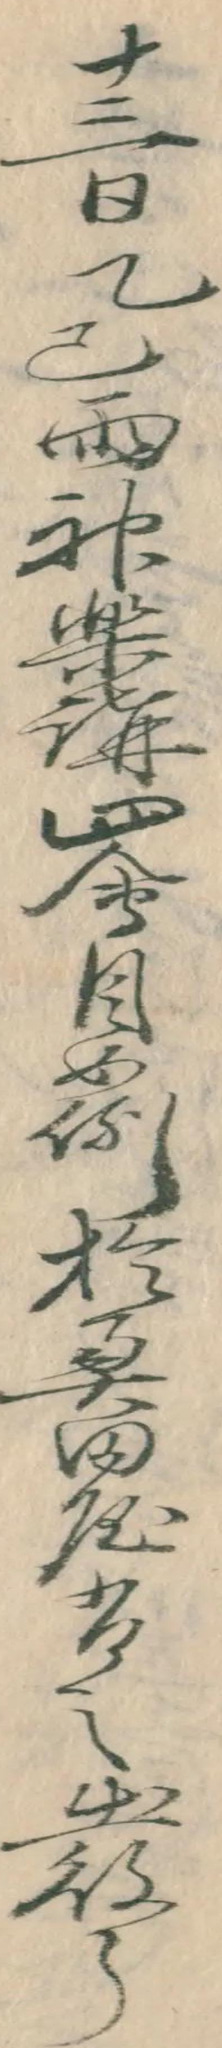十三日乙巳雨神楽講四會目如例於奥田屋有之出役了
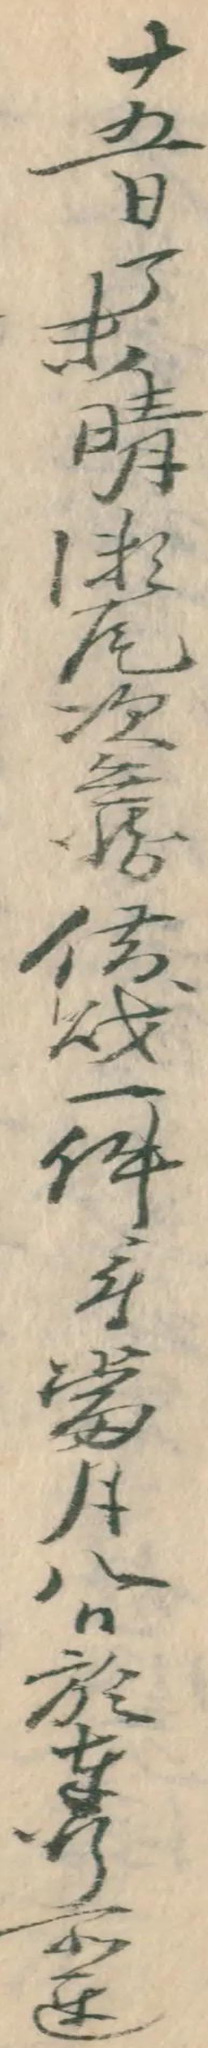十五日丁未晴瀬尾次兵衛借財一件ニ付當月八日於奉行所達
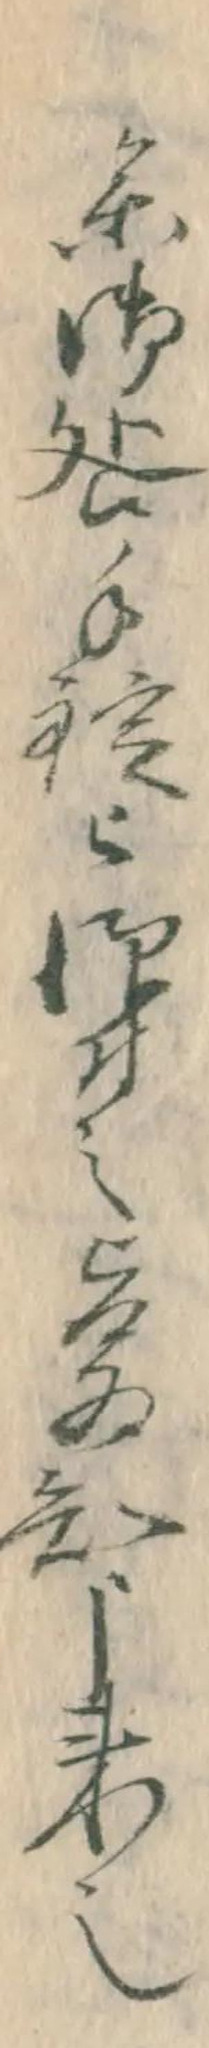参御咎手詫被仰付之旨為知申来也

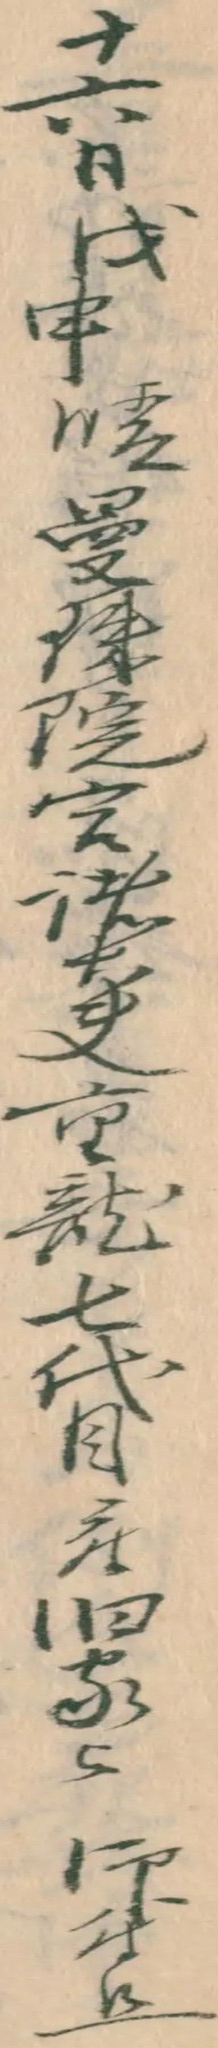十六日戊申曇曼殊院宮諸大夫重龍七代目ニ付旧家被仰付且
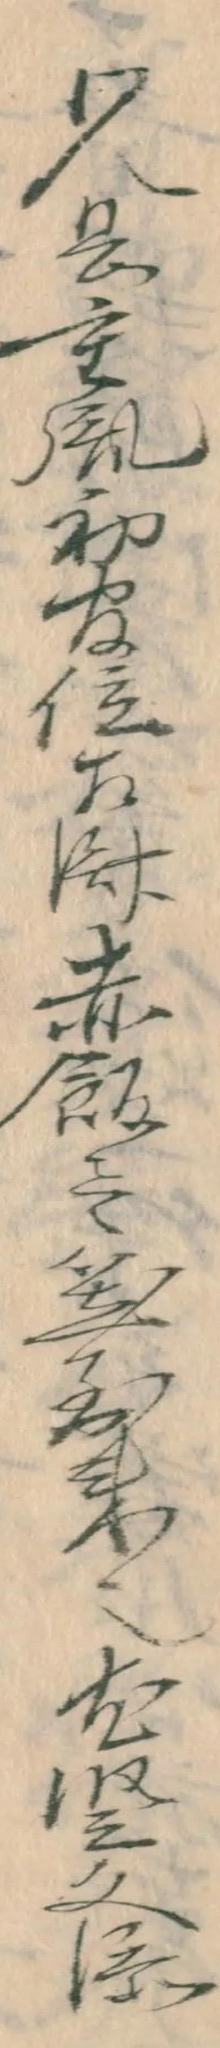同人息重胤初官位相済赤飯壱箱到来也尤堅久添
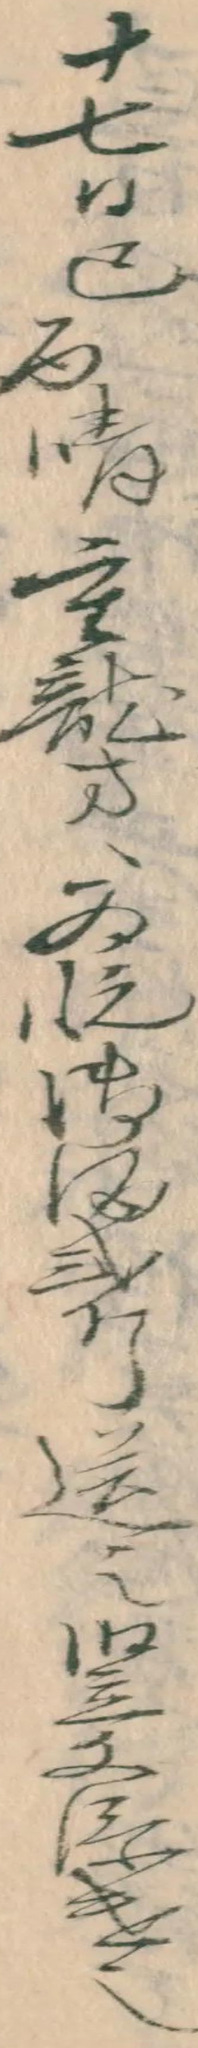十七日己酉晴重龍方へ為祝御酒弐升送之堅文添遣之
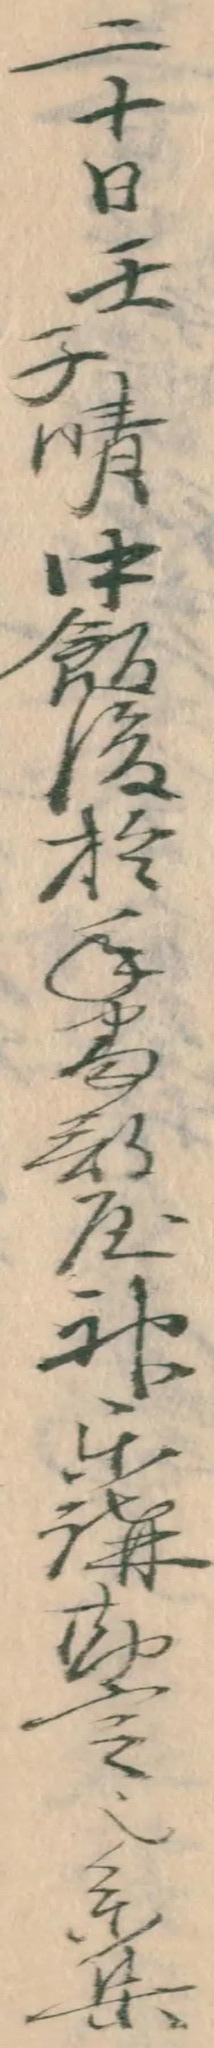二十日壬子晴中飯後於年番部屋神楽講勘定也参集
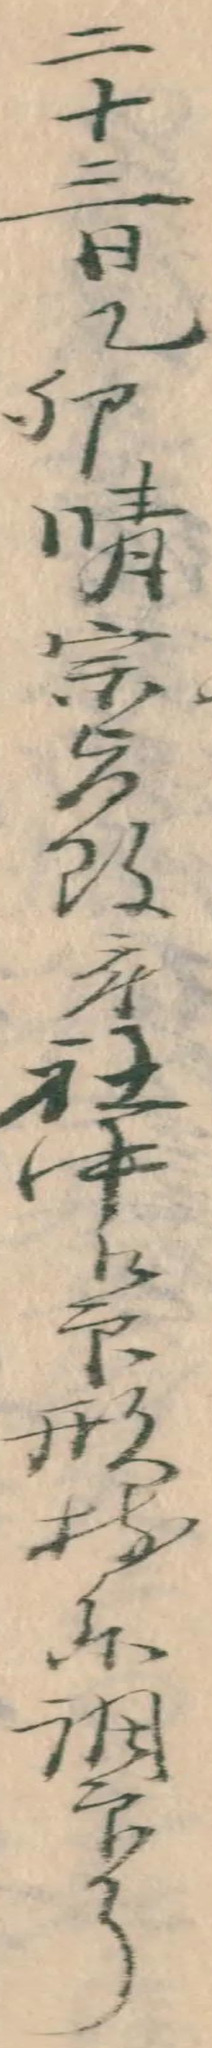二十三日乙卯晴宗旨改ニ付社中江印形持参調印了
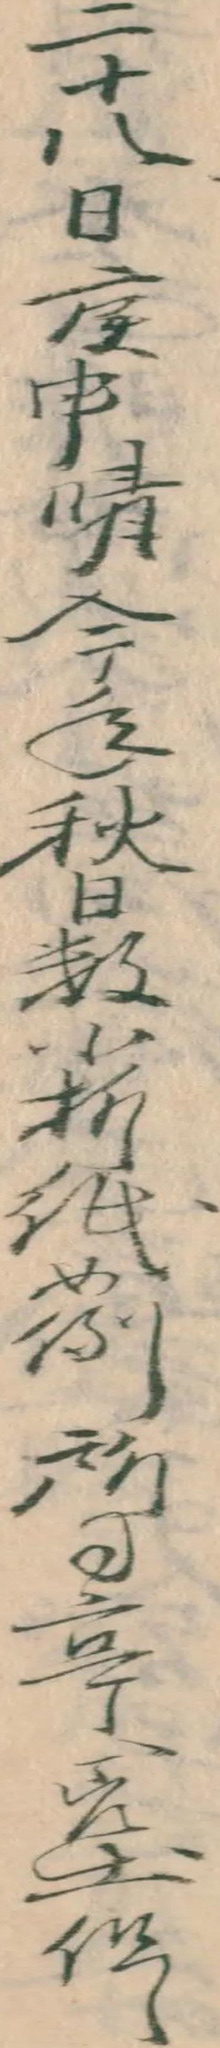二十八日庚申晴今年秋日数小折紙如例所司亭へ差出但し
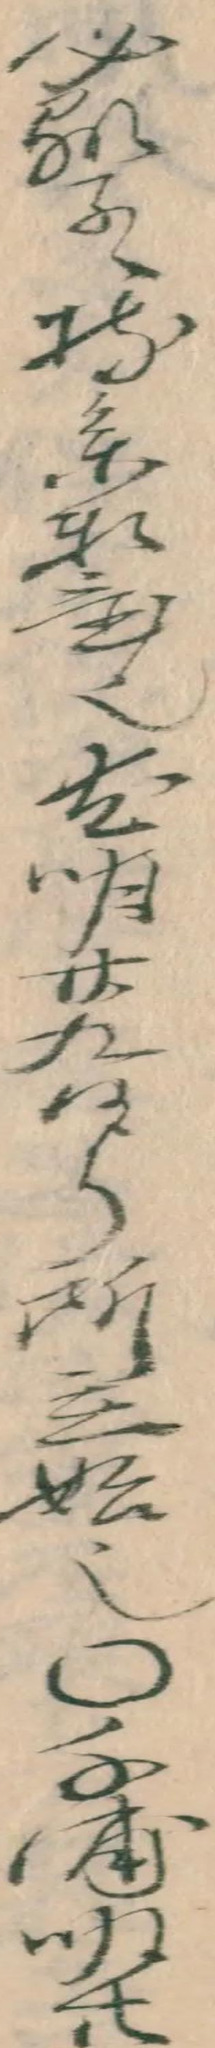必顕子へ持参頼置也尤明廿九日より所立始也○千浦明廿
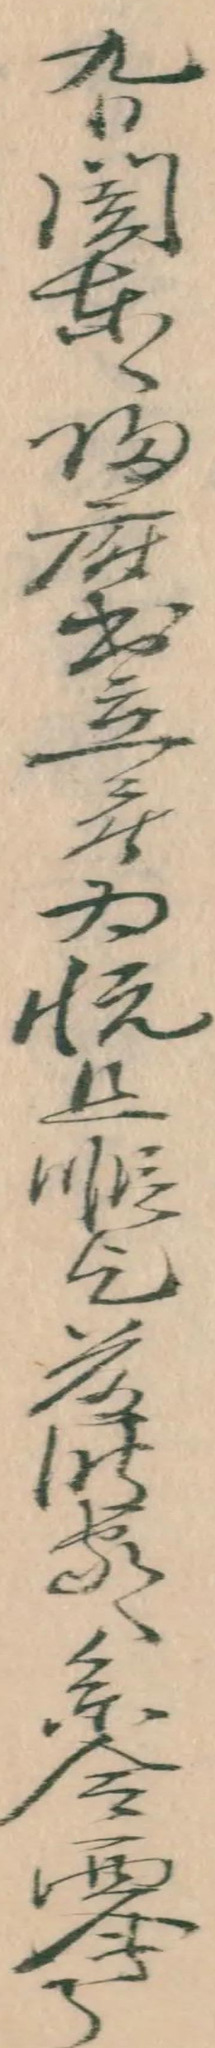九日関東へ帰府出立ニ付為祝且暇乞藤時家へ参令面會了
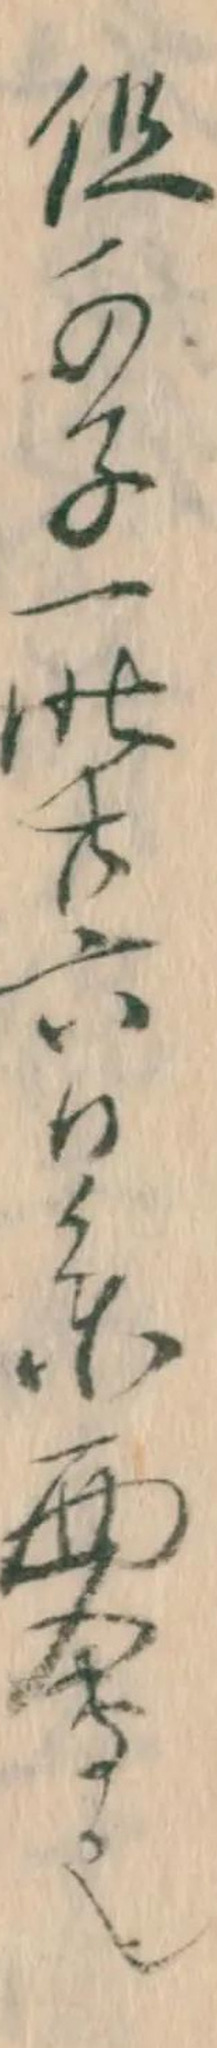但千子一昨廿六日参面會也
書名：賀茂社記録. 第66冊
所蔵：国立国会図書館 National Diet Library, JAPAN
